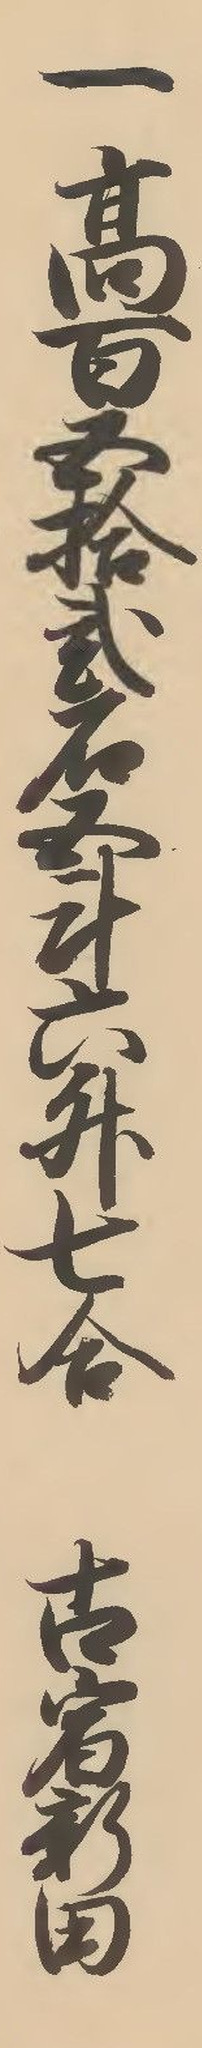一高百五拾弐石五斗六升七合古宿新田

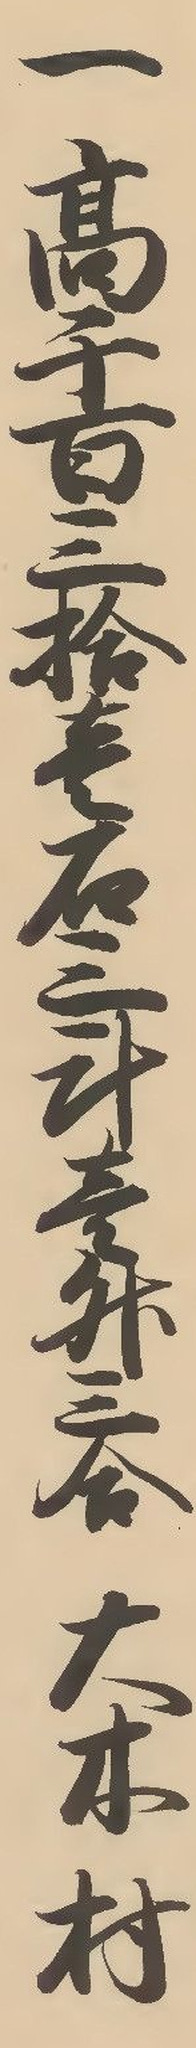一高千百三拾壱石三斗壱升三合大木村
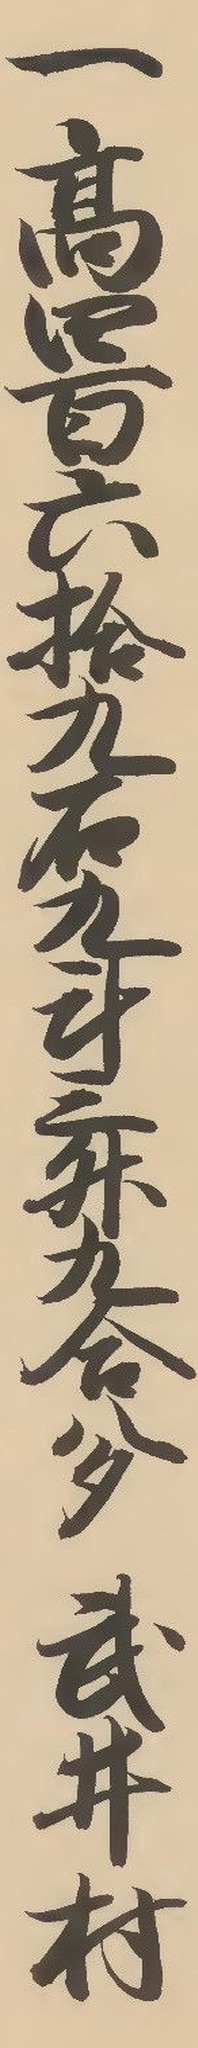一高四百六拾九石九斗三升九合八勺武井村
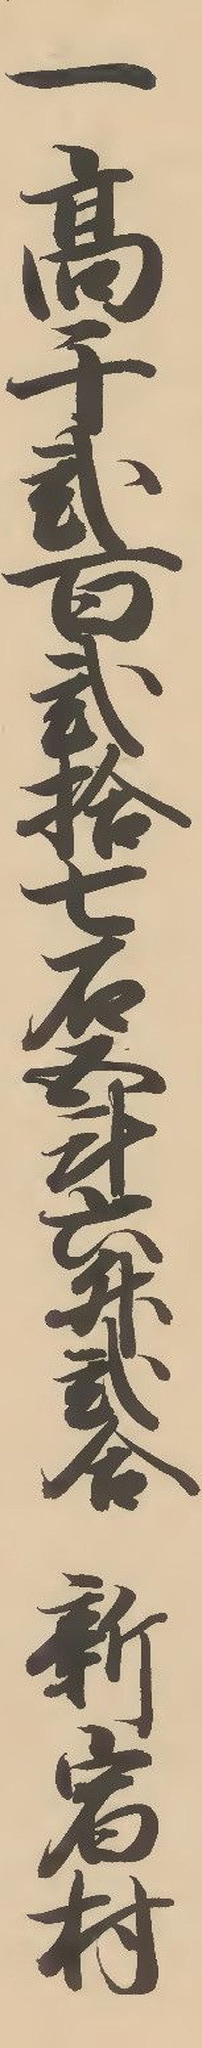一高千弐百弐拾七石五斗六升弐合新宿村
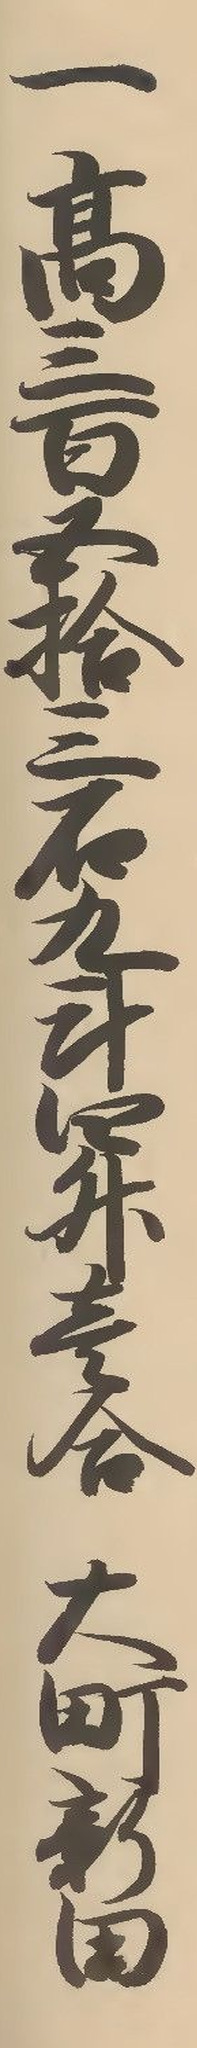一高三百五拾三石九斗四升壱合大町新田
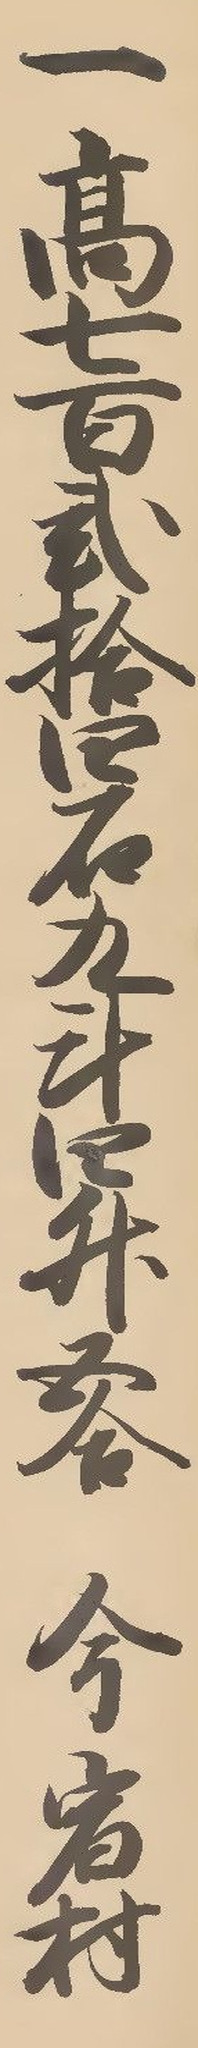一高七百弐拾四石九斗四升五合今宿村
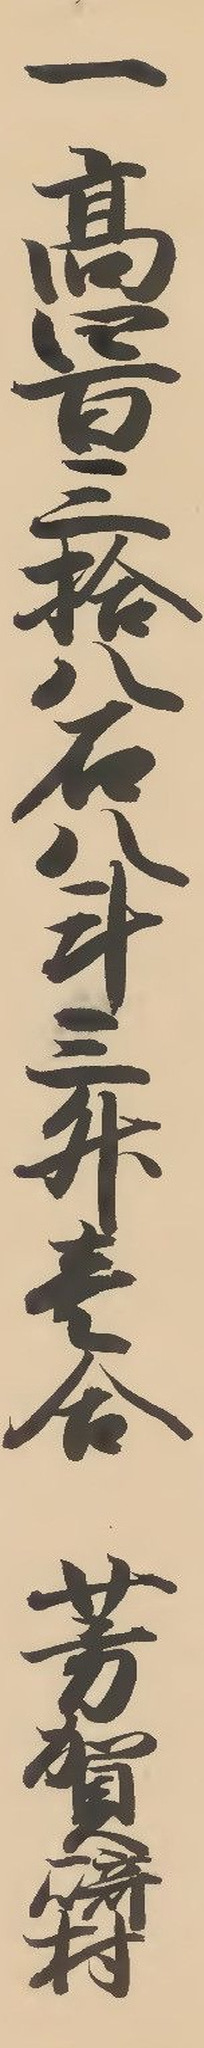一高四百三拾八石八斗三升壱合芳賀崎村
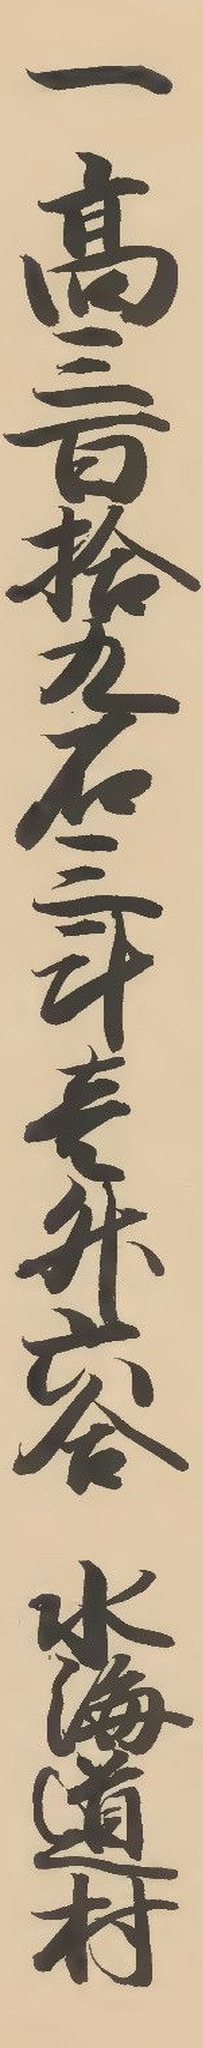一高三百拾九石三斗壱升六合水海道村
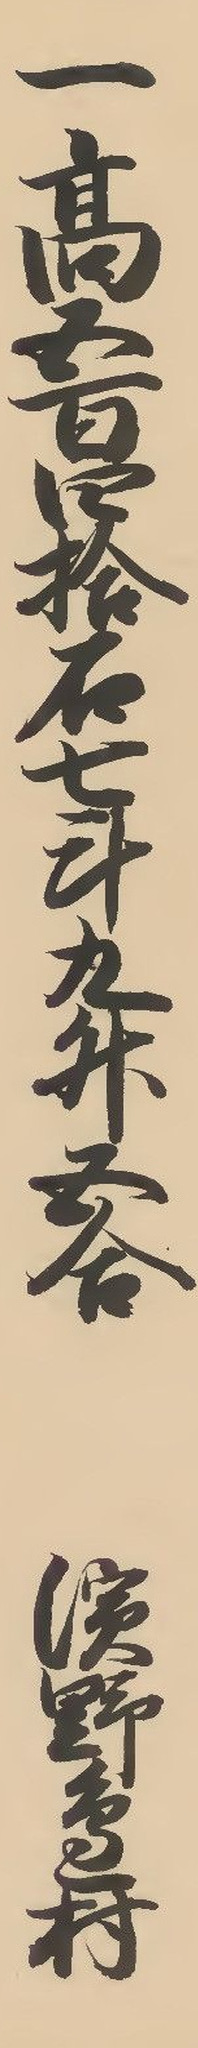一高五百四拾石七斗九升五合浜野辺村

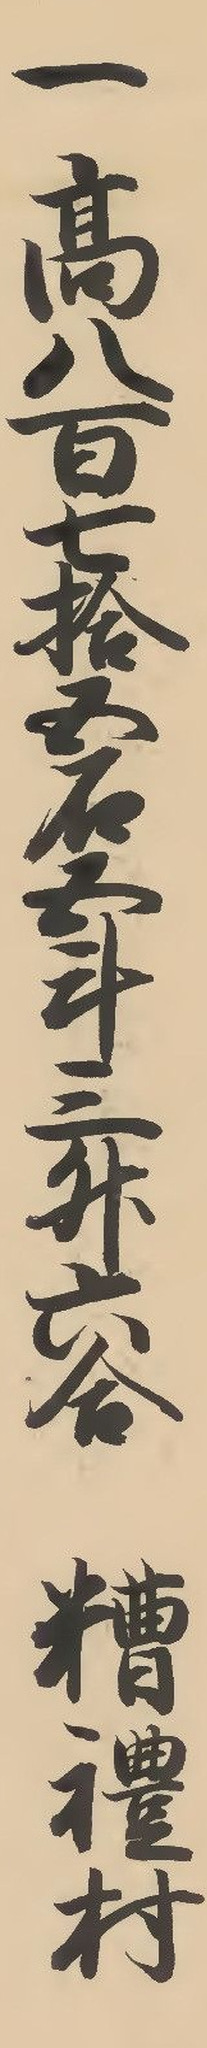一高八百七拾五石五斗三升六合糟礼村
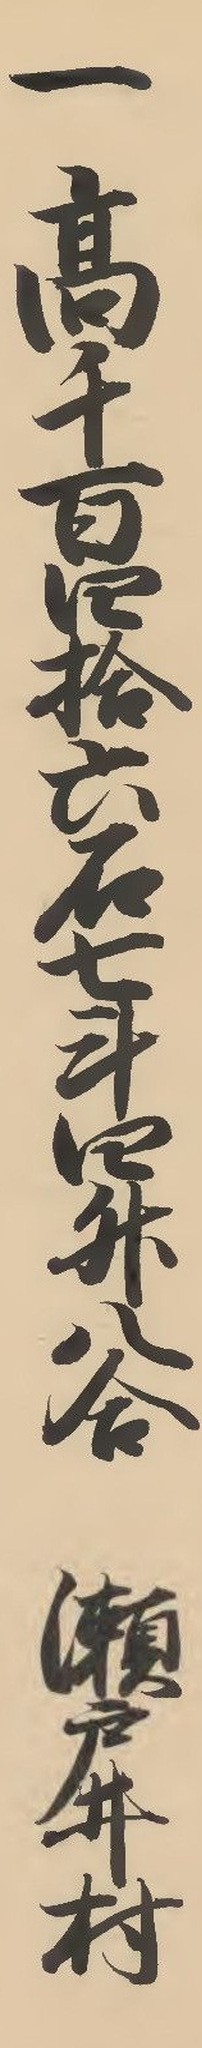一高千百四拾六石七斗四升八合瀬戸井村
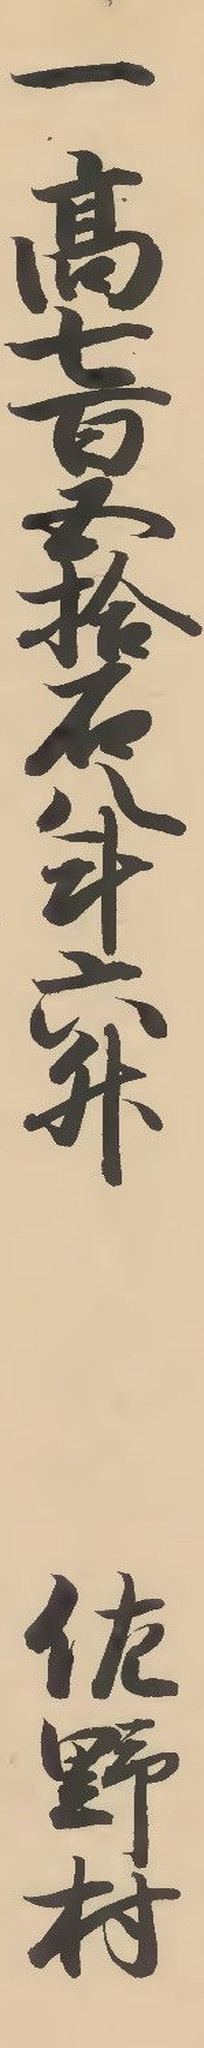一高七百五拾石八斗六升佐野村
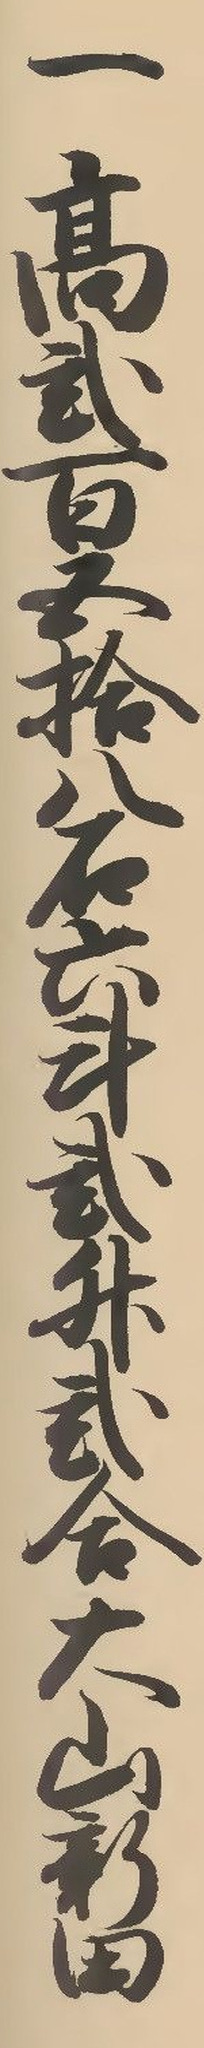一高弐百五拾八石六斗弐升弐合大山新田
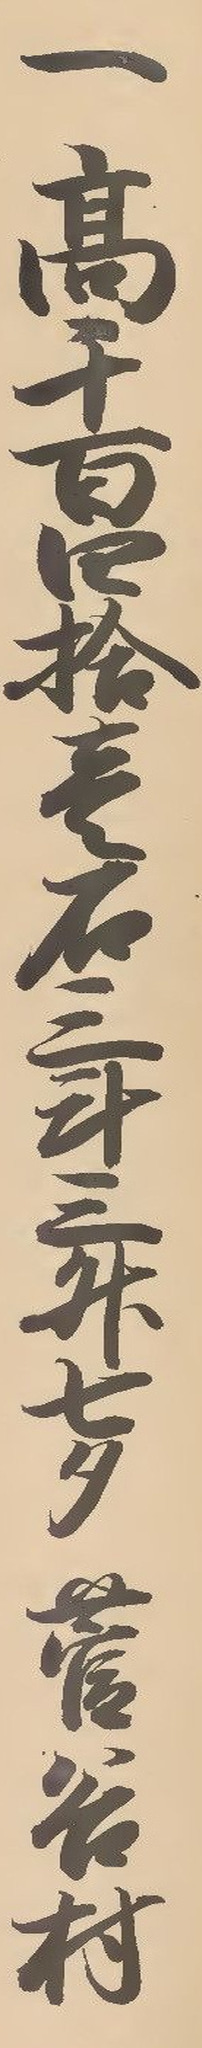一高千百四拾壱石三斗三升七勺菅谷村
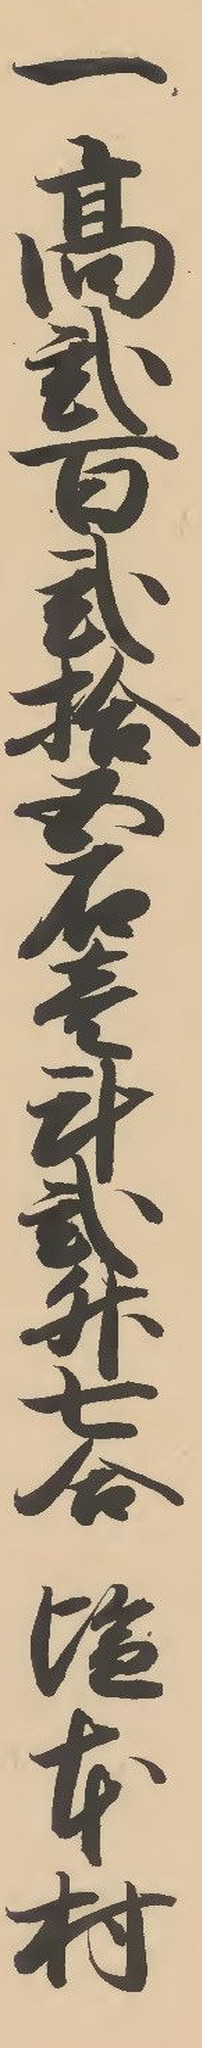一高弐百弐拾五石壱斗弐升七合塩本村

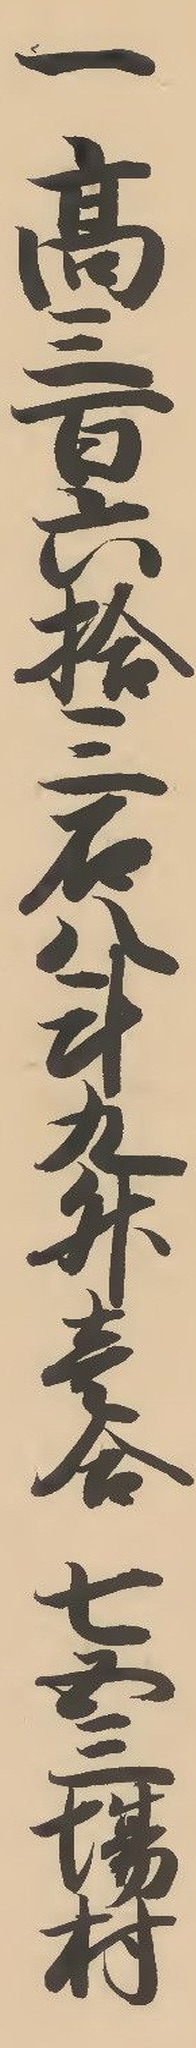一高三百六拾三石八斗九升壱合七五三場村
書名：下総国郷帳
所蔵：国立公文書館 National Archives of Japan
